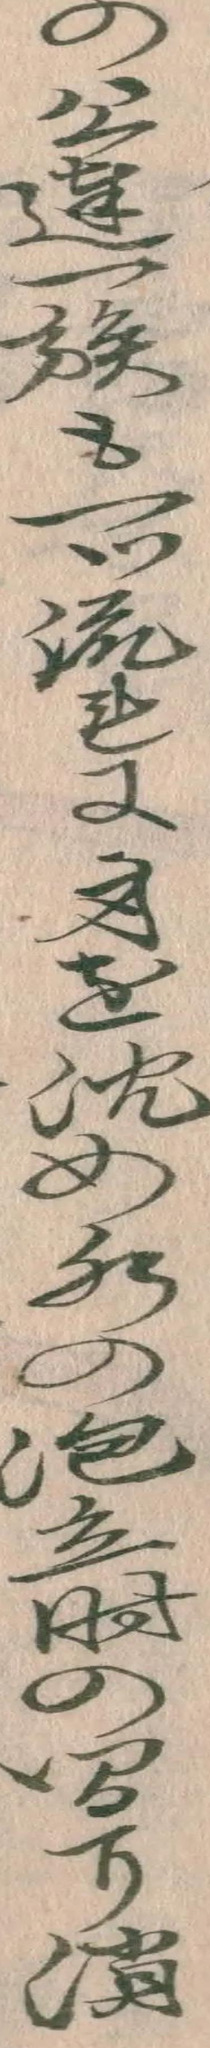の公達一族も一つ流れに身を沈め水の泡立時の間に消
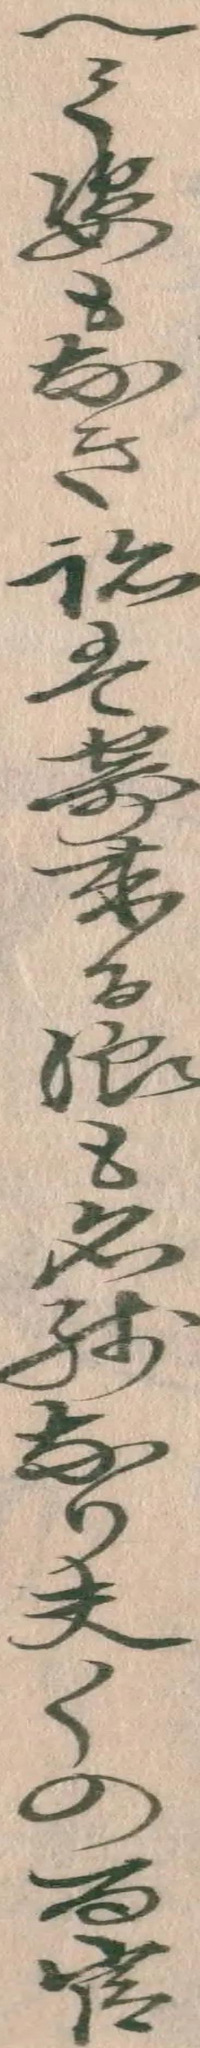へて姿もなき跡は寄来る浪も名残なり夫〳〵の百官
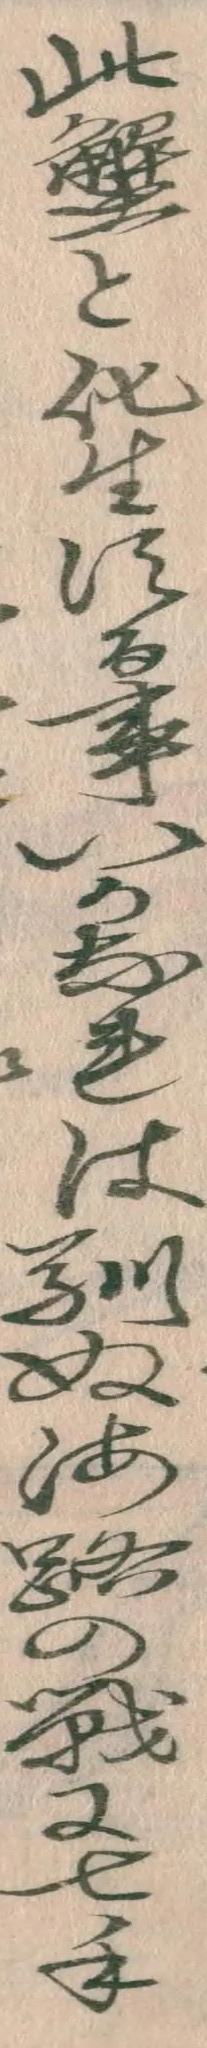此蟹と化生する事いかなれは馴ぬ海路の戦に七手
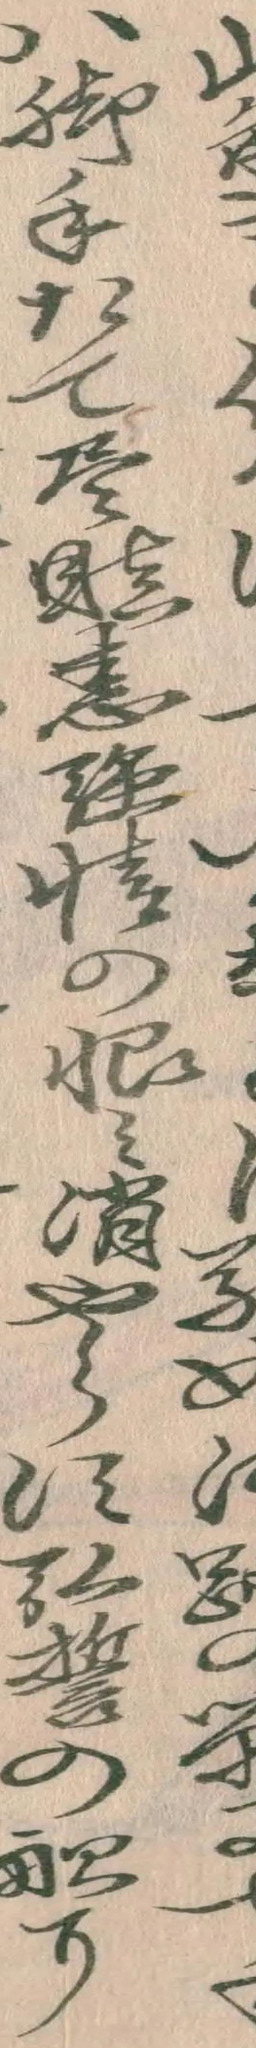八脚手たて尽瞋恚強情の恨み消やらす弘誓の船に
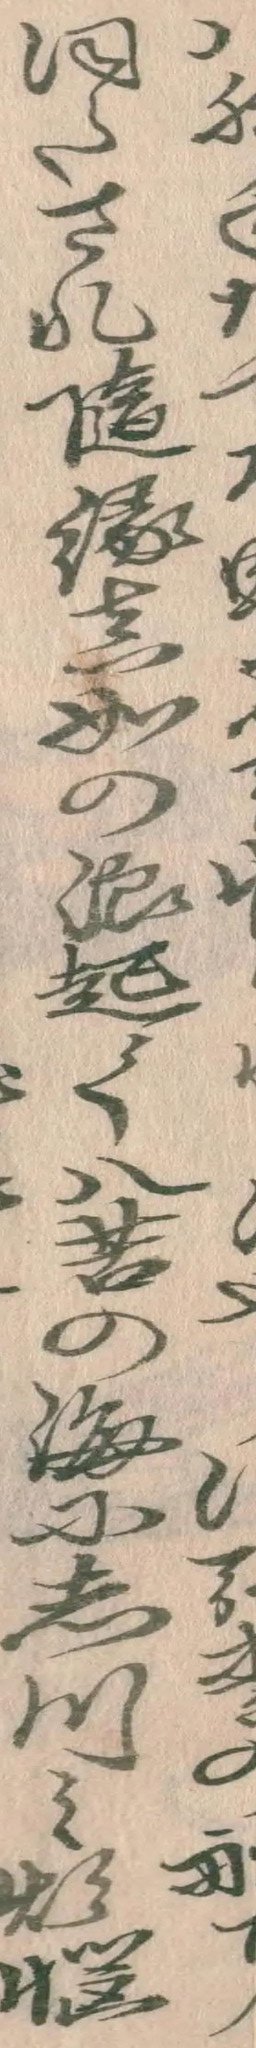ほたされ随縁真如の浪起て八苦の海にしつみ煩悩
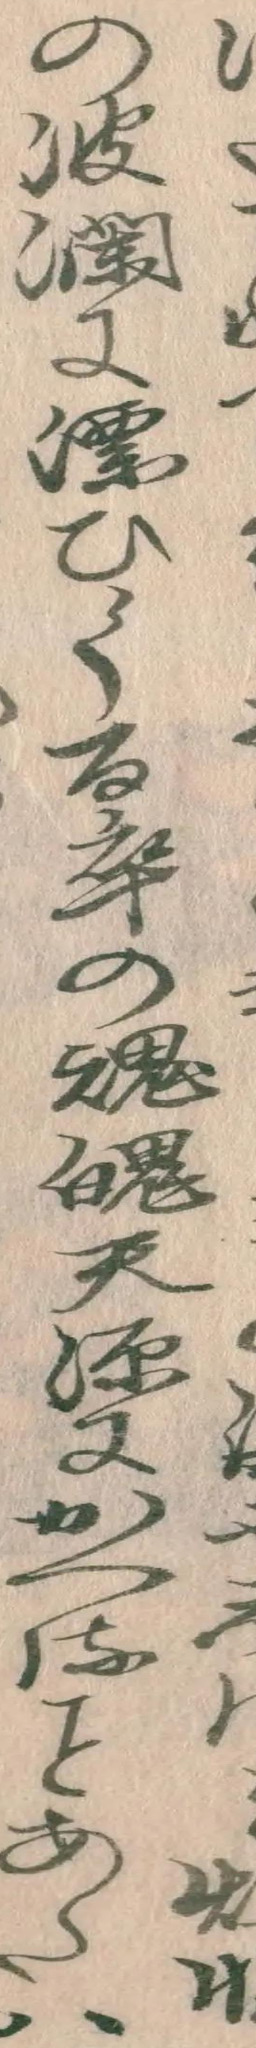の波瀾に漂ひて百卒の魂魄天源にかへることあたは
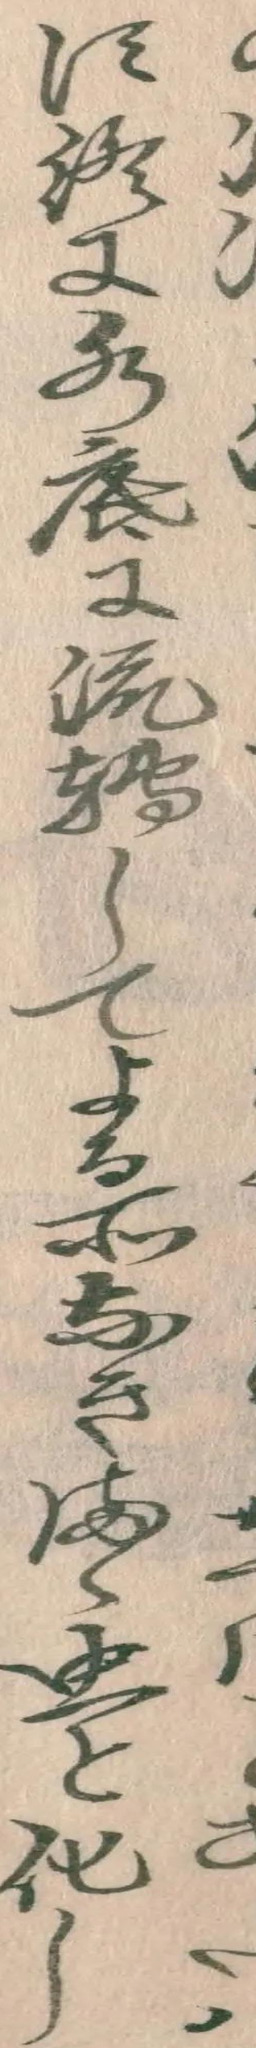す終に水底に流転してよる所なきまゝ虫と化し
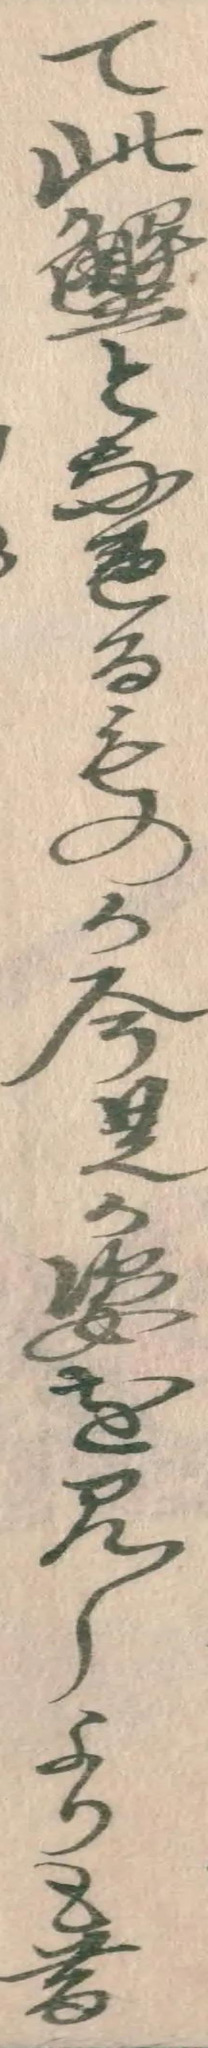て此蟹となれるものか今是か姿を見しよりも昔
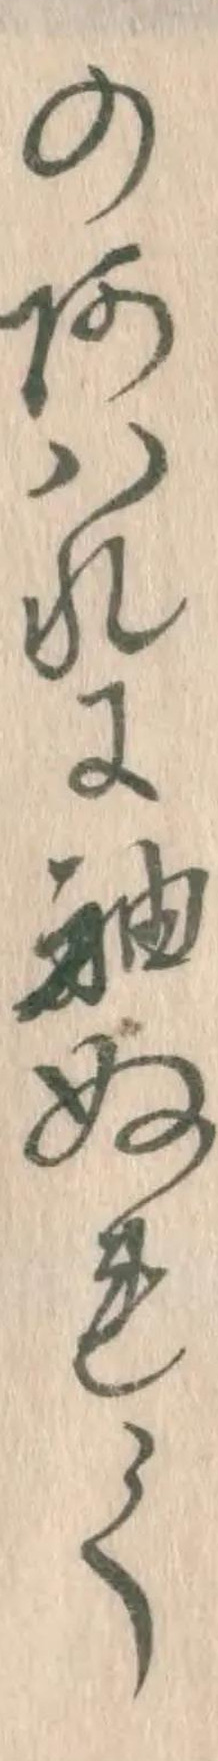のあはれに袖ぬれて
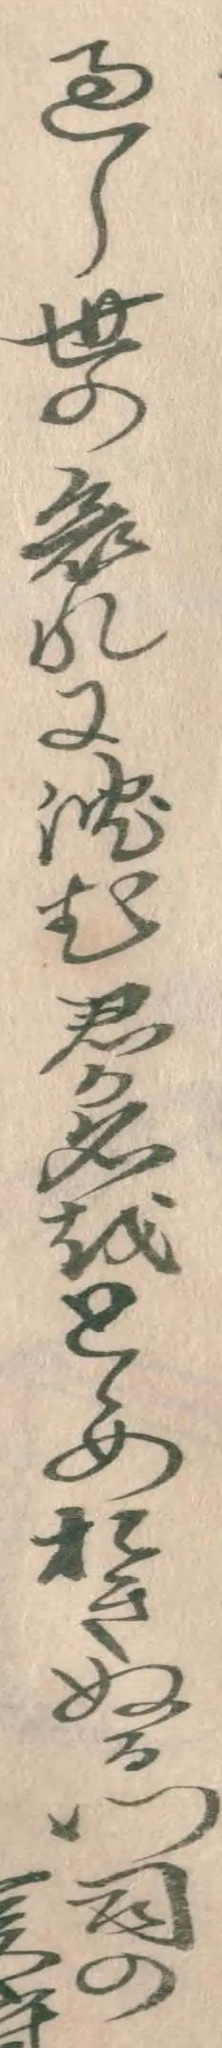過し世の哀れに沈む君か名をとゝめおきぬる門司の
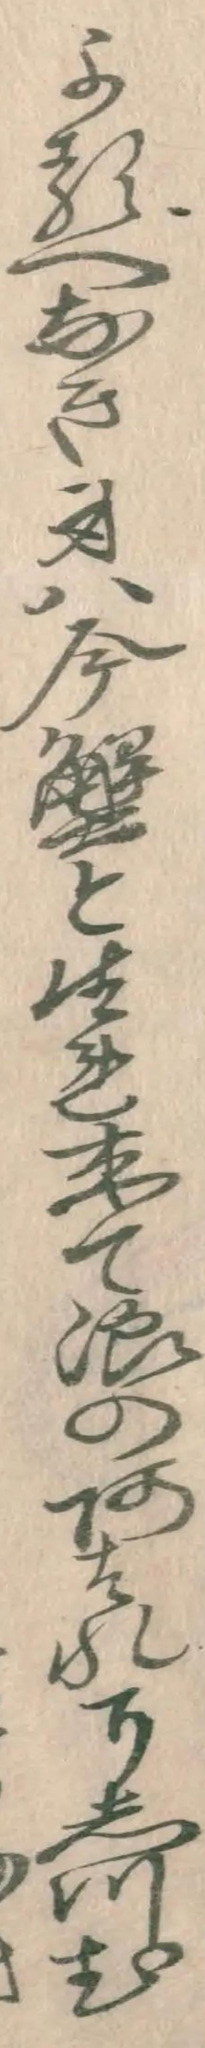よるへなき身は今蟹と生れ来て浪のあはれにしつむ

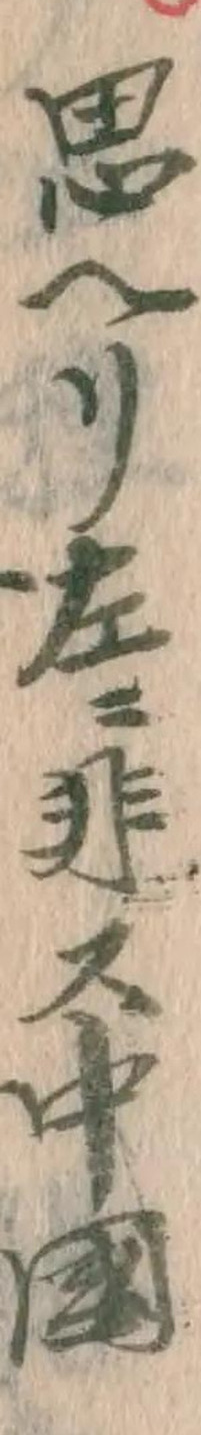思ヘリ左ニ非ス中国
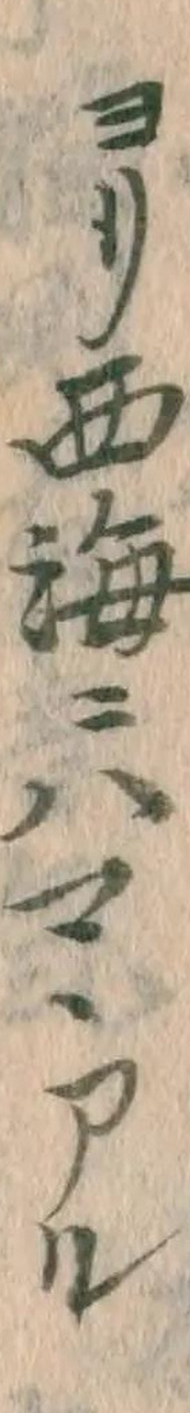ヨリ西海ニハマヽアル
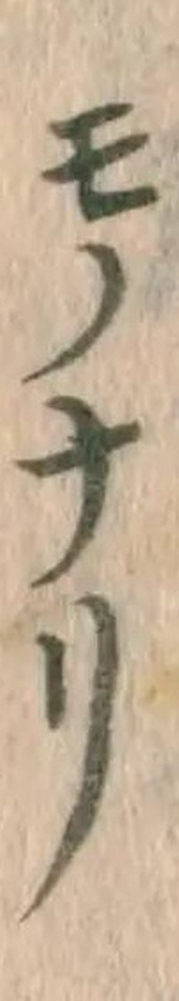モノナリ

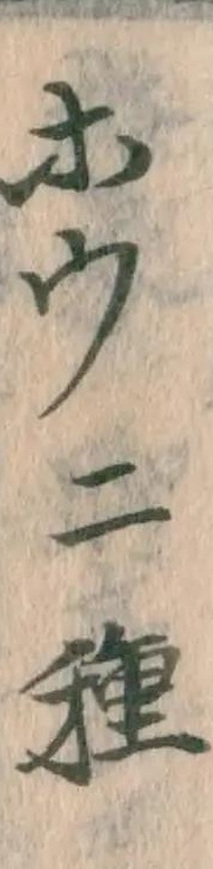ホウ二種
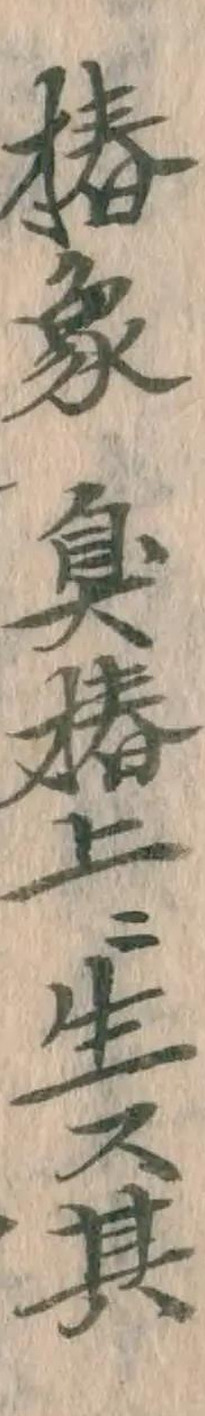椿象臭椿上ニ生ス其
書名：千蟲譜 3巻. [3]
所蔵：国立国会図書館 National Diet Library, JAPAN
